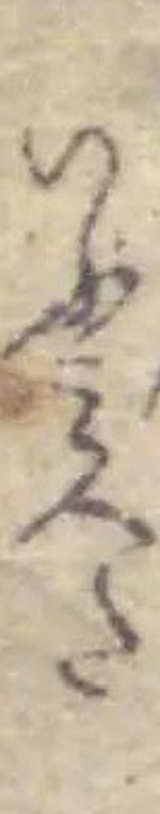いふみへた

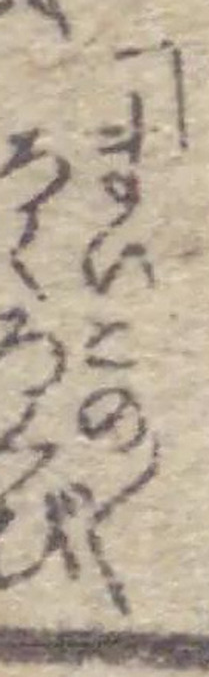〽まいこの〳〵
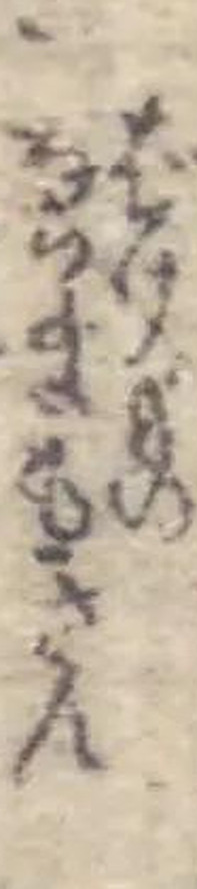なかまもきん
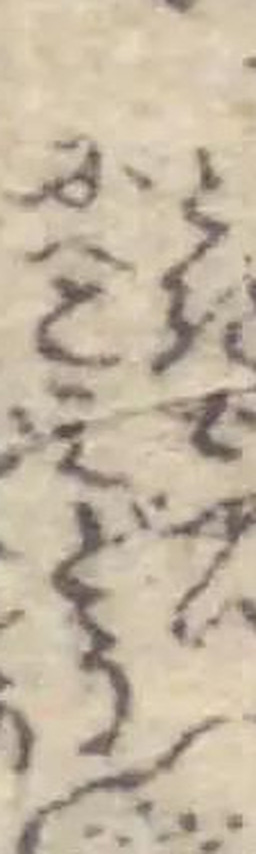にへこみどう
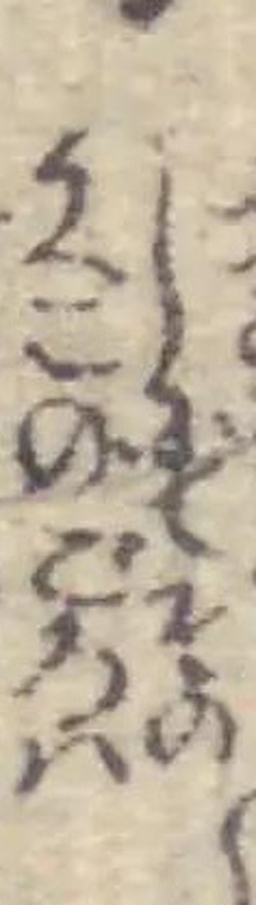うへこのごろは
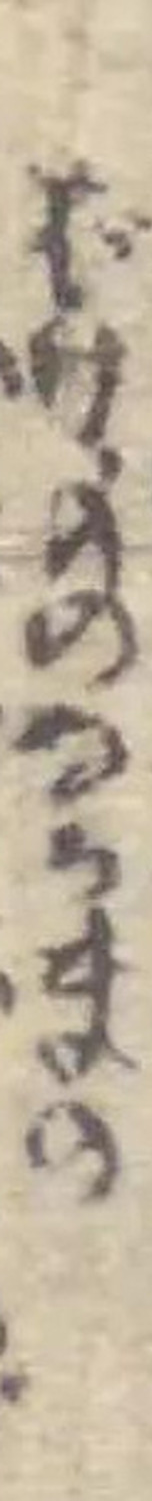ばけものなかまの
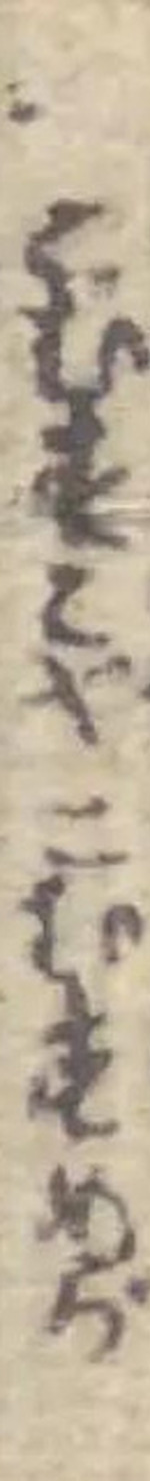こむすこやこむすめが
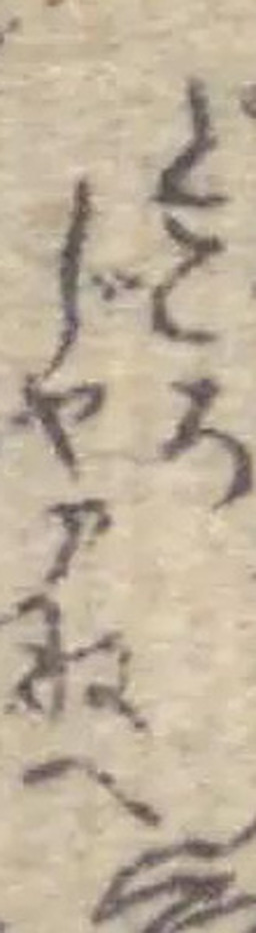じヤァねへ
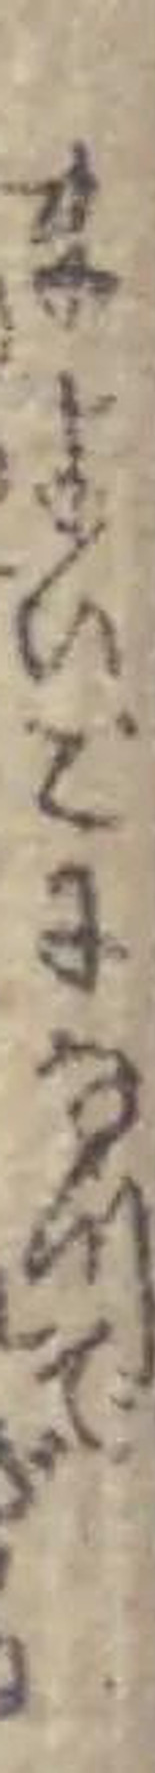まよいごになつて
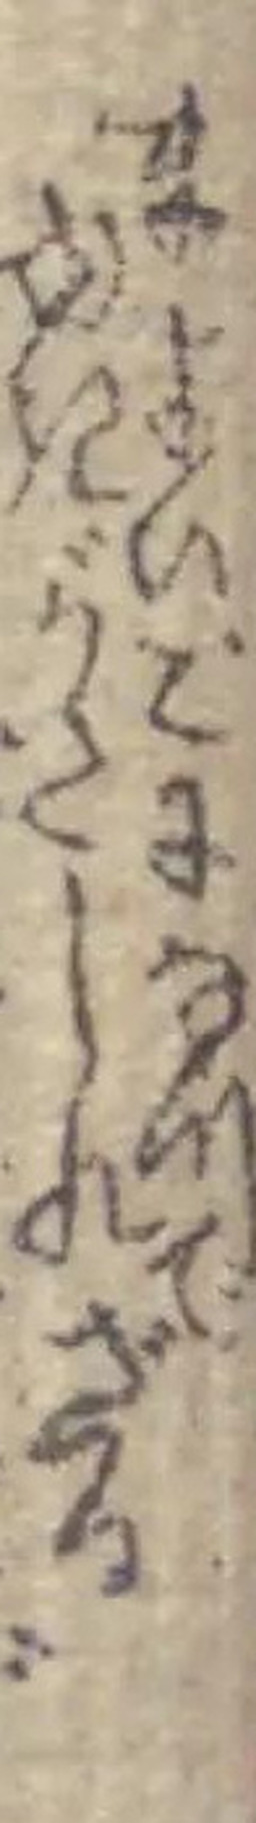ゆきがたしれざる
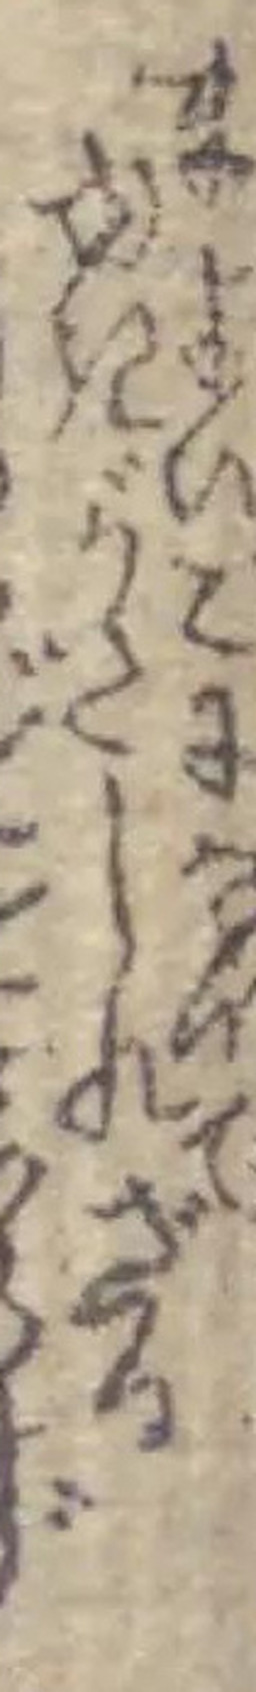ゆきがたしれざる
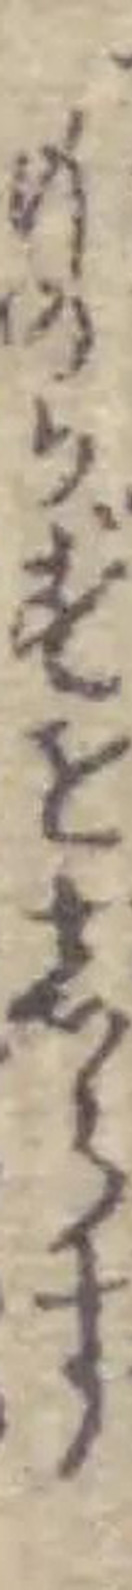ものかずをしらず
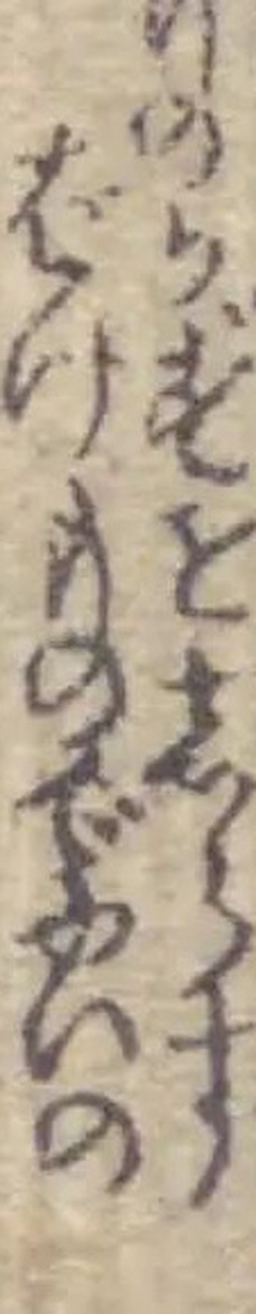ばけものでやいの
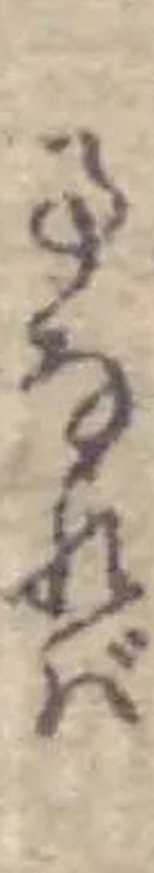事なれば
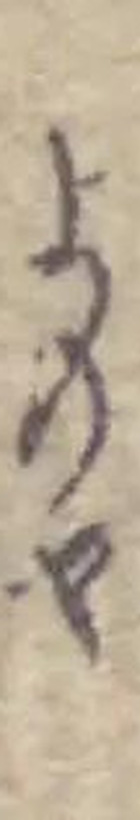よもや
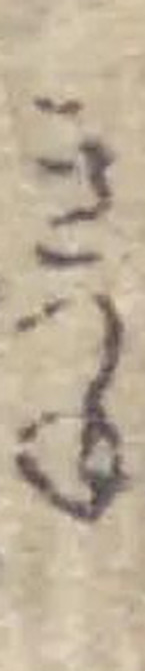きつね
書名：化物尽 4巻
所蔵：国立国会図書館 National Diet Library, JAPAN
